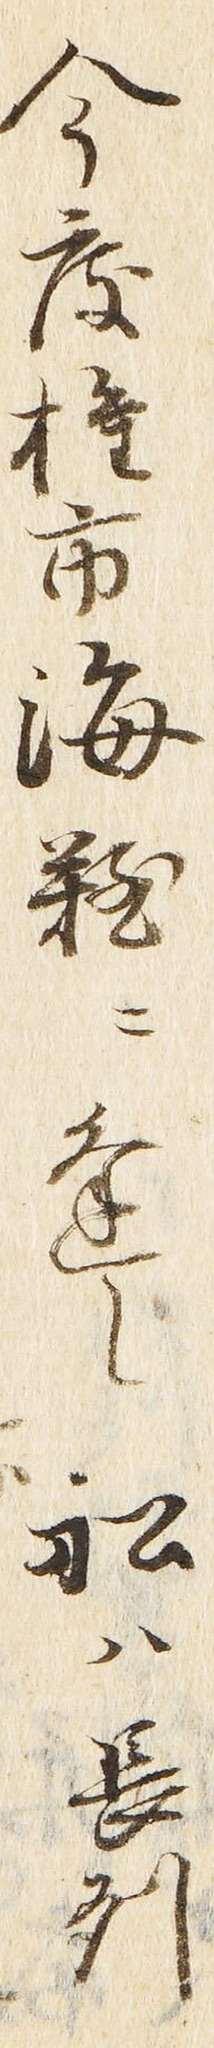今度権市海難逢し船は長州
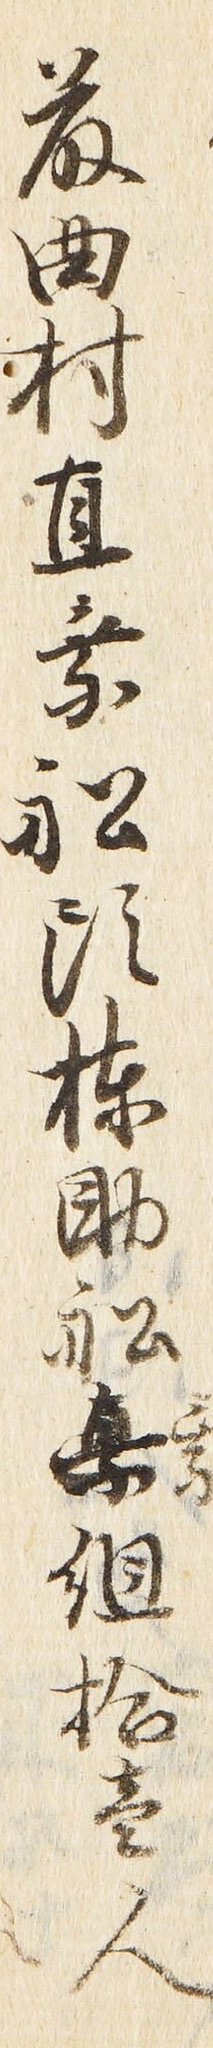藤曲村直乗船頭棟助船乗組拾壱人
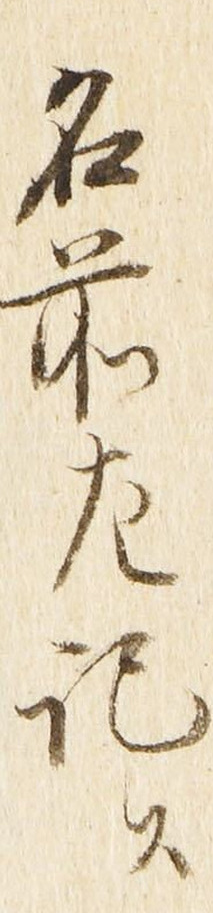名前左記ス
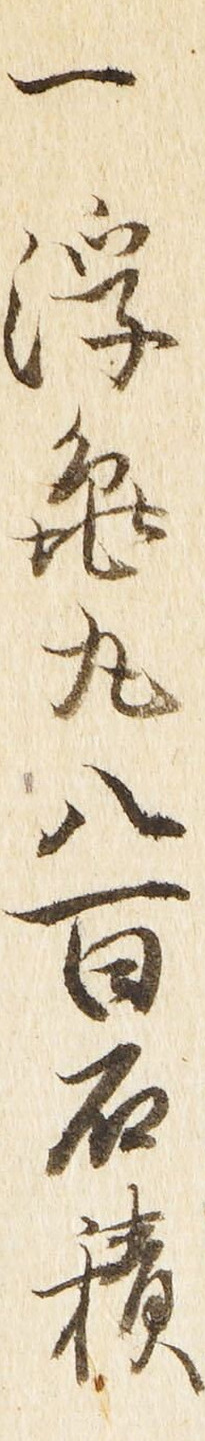一浮亀丸八百石積
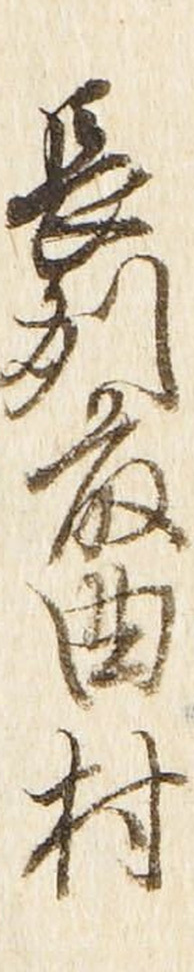長州藤曲村
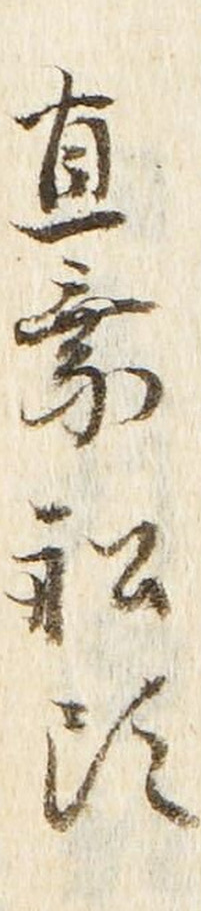直乗船頭

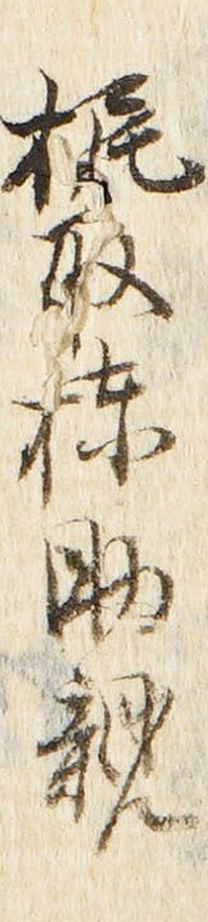梶取棟助親
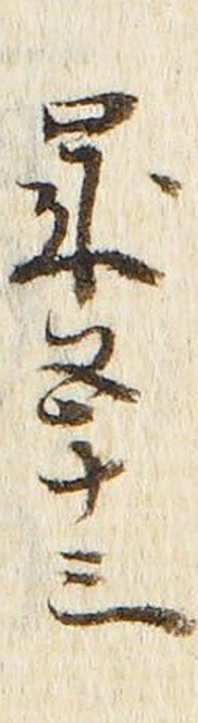歳五十三
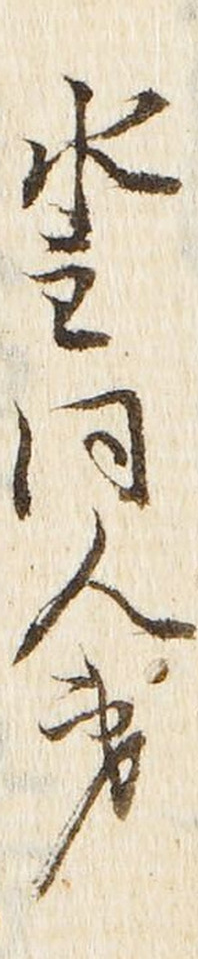水主同人弟
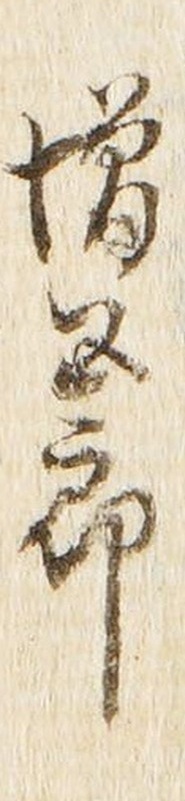増五郎
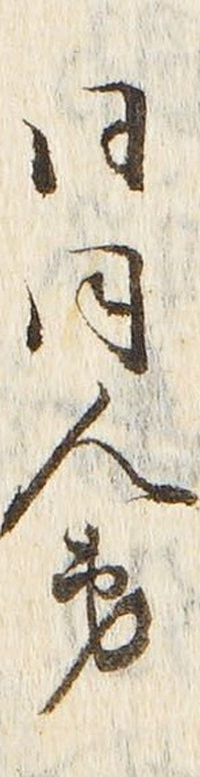同同人弟
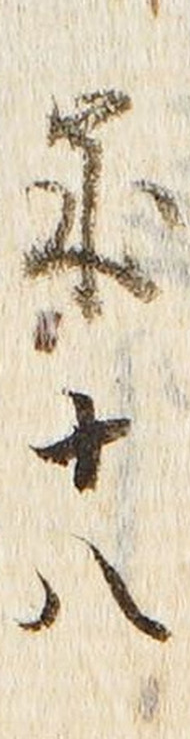歳十八
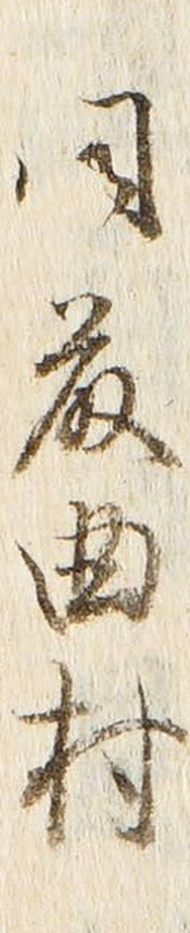同藤曲村
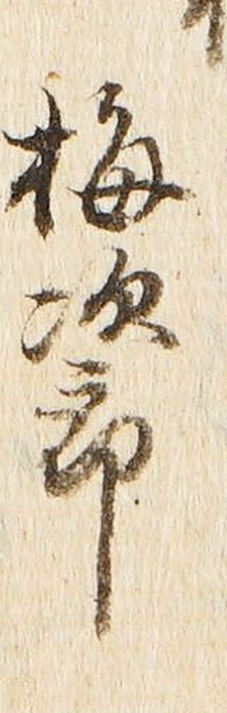梅次郎
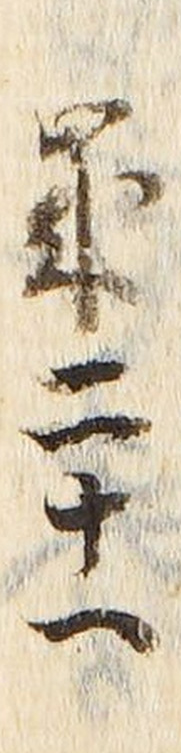歳二十一
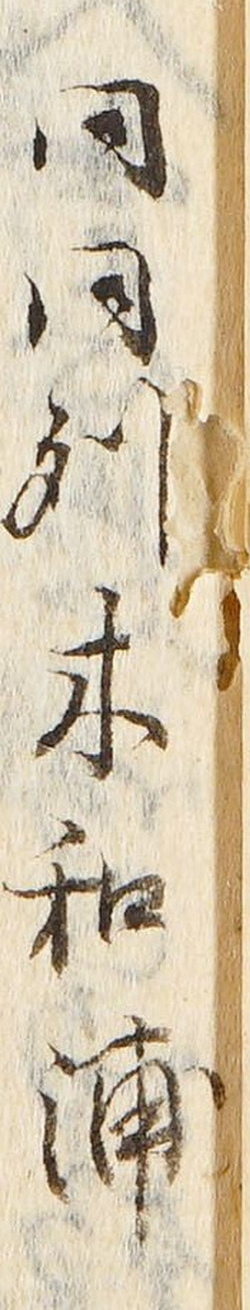同同州木和浦
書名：唐物語
